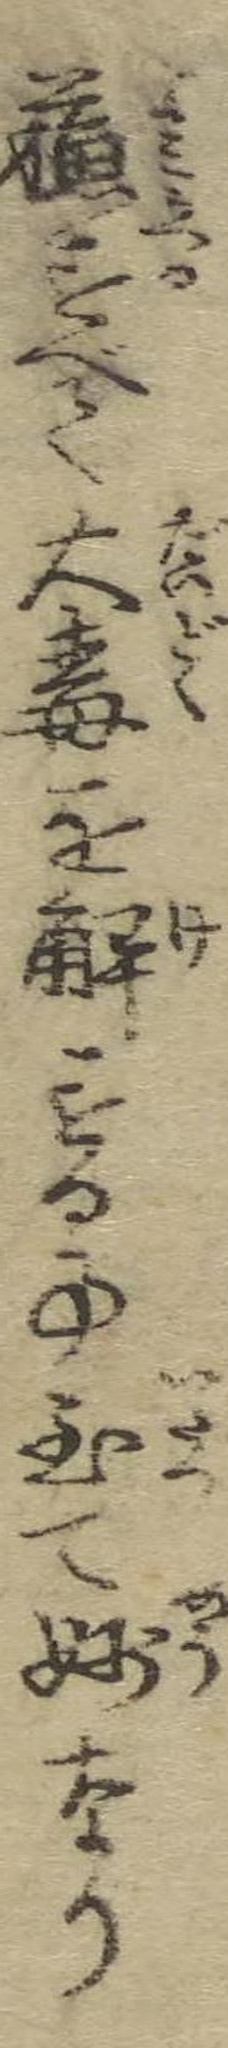蘇すべて大毒を解する事至て妙なり
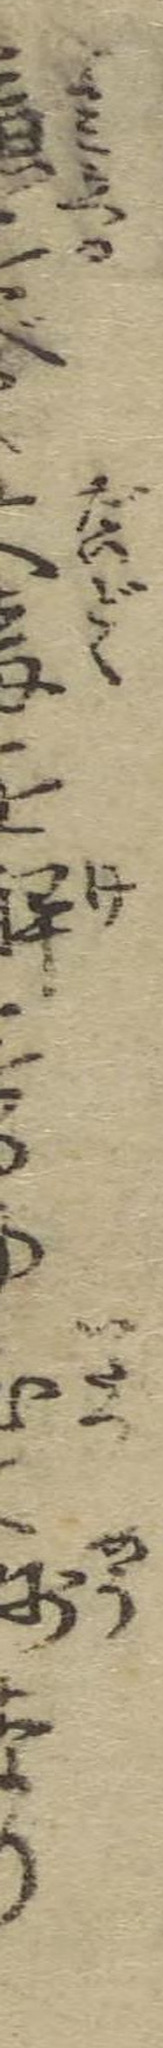蘇すべて大毒を解する事至て妙なり
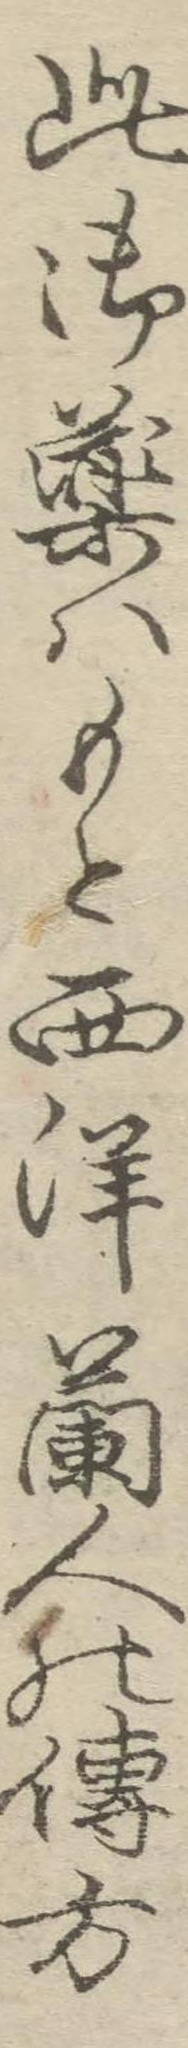此御薬は。もと西洋蘭人の傳方
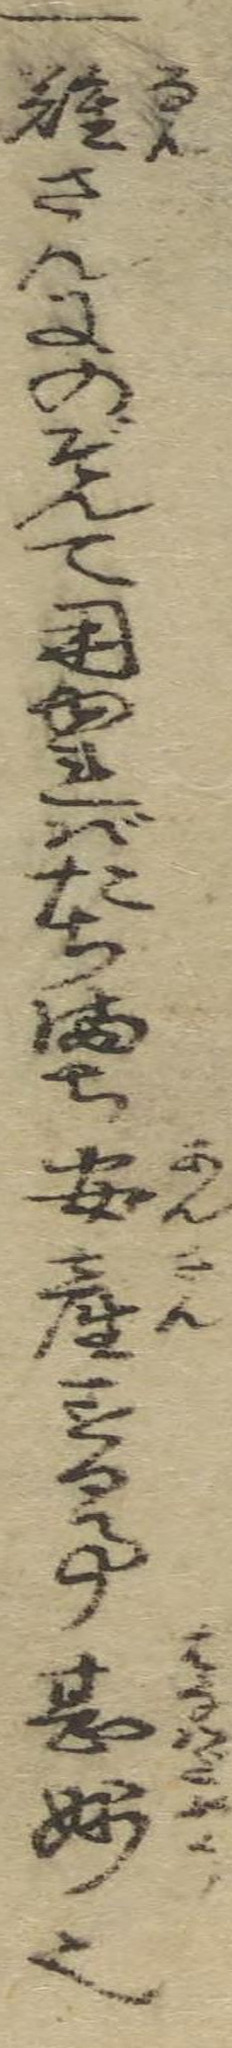一難さんにのぞんて用ゆればたちまち安産する事甚妙也
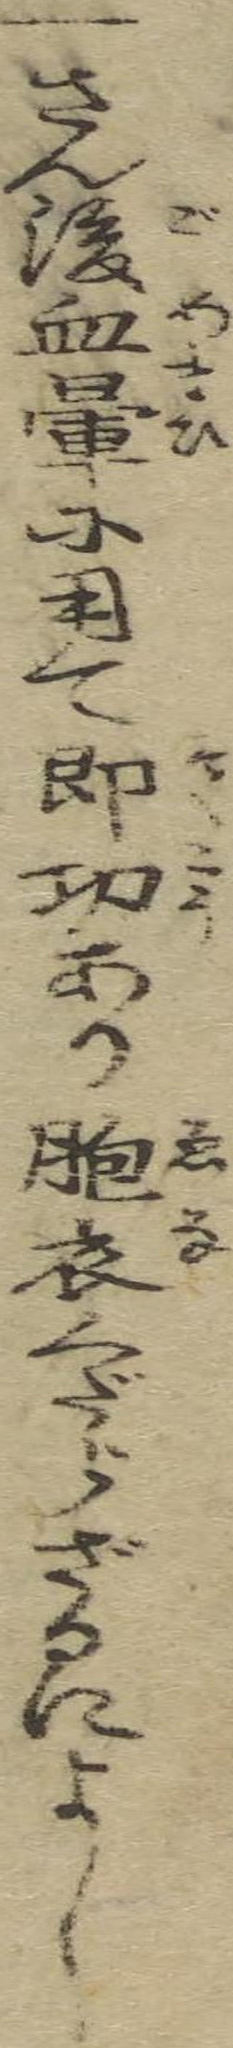一さん後血暈に用て即功あり胞衣くだらざるによし
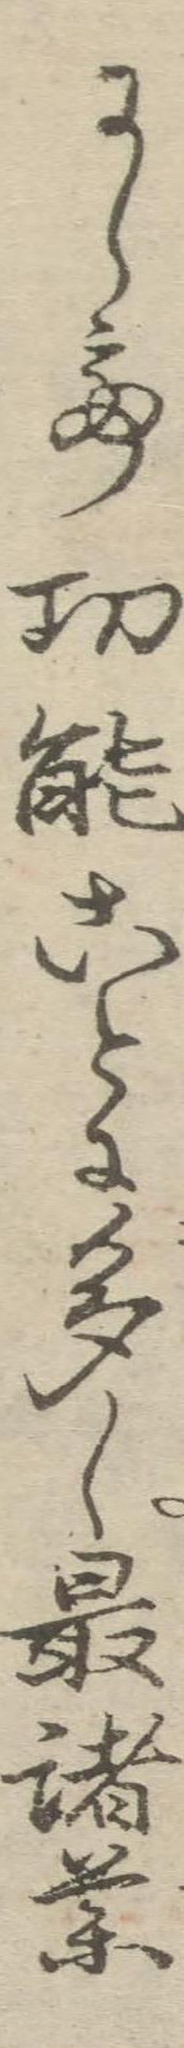にして。功能ことに多し。最諸薬
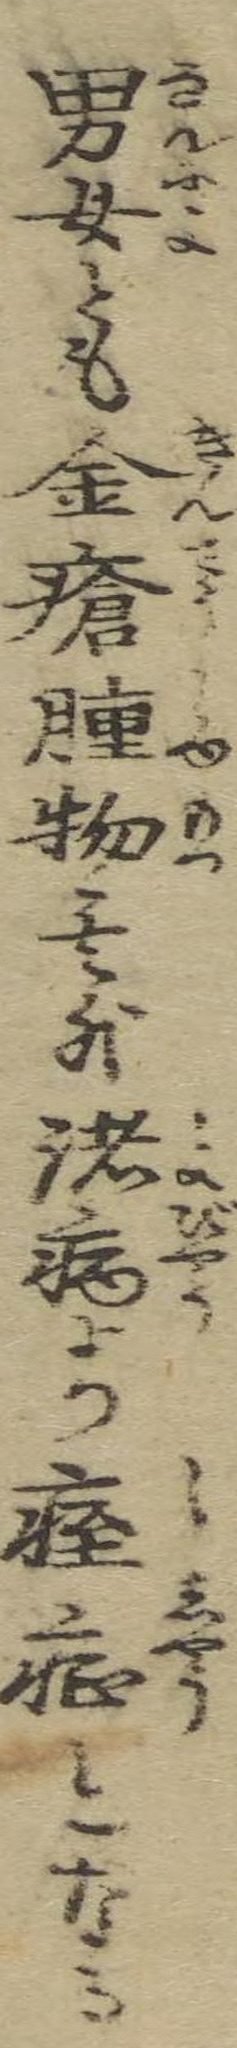男女とも金瘡腫物其外諸病より痓症となる
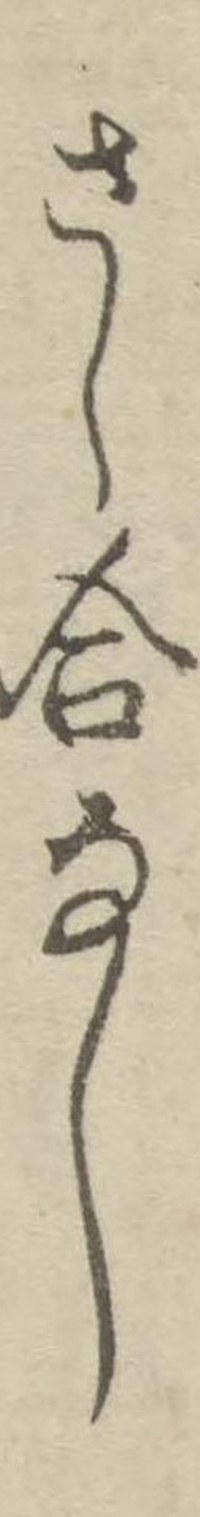さし合なし
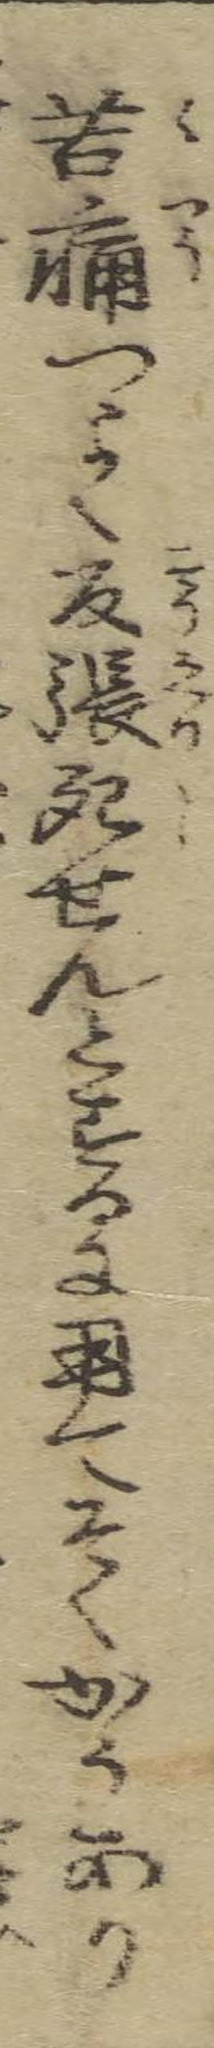苦痛つよく反張死せんとするに用てそくかうあり
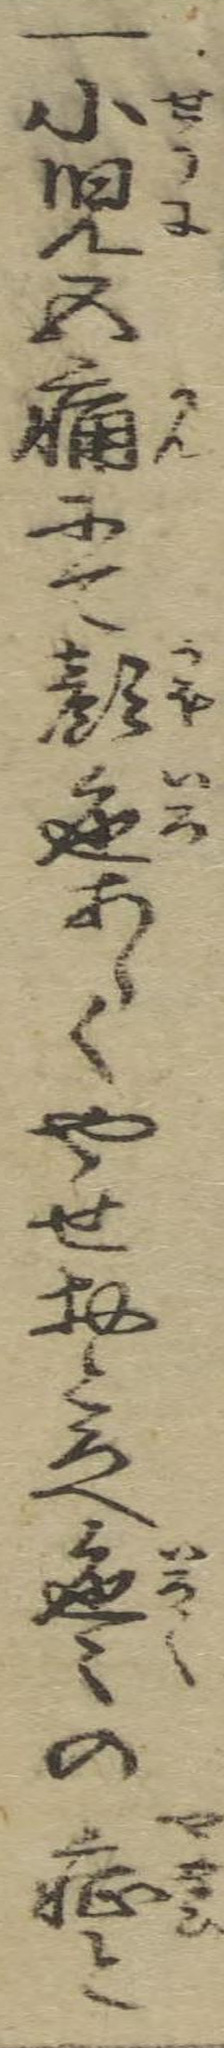一小児五痛にて顔色あしくやせおとろへ色々の症と
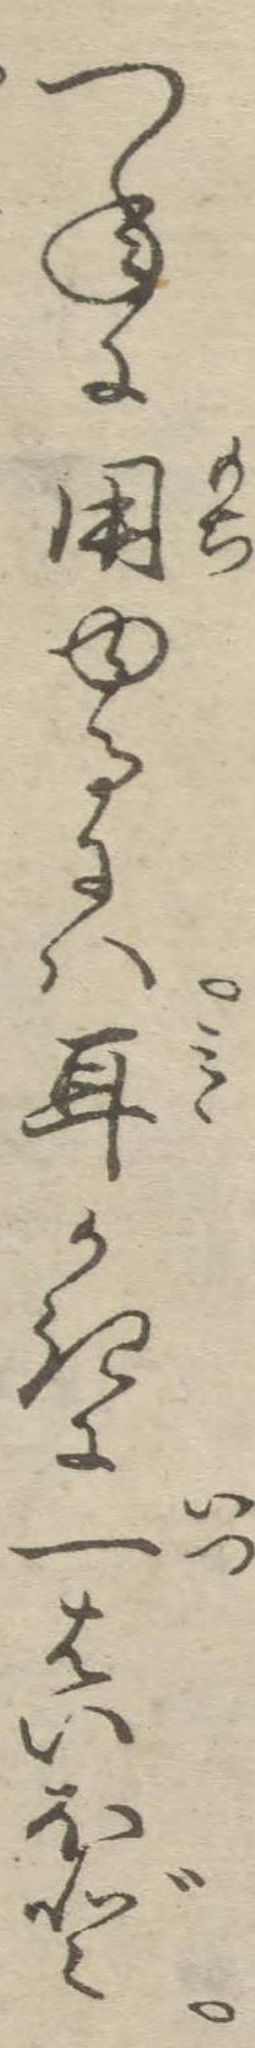つねに用ゆるには。耳かきに一はいほど。
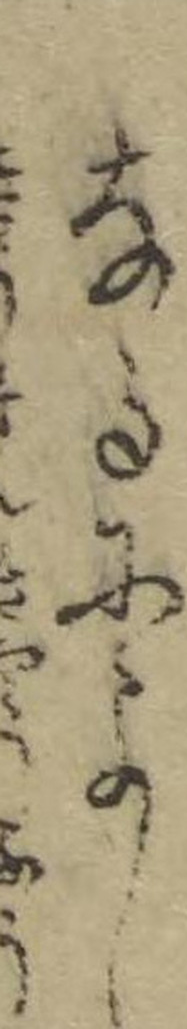なるによし
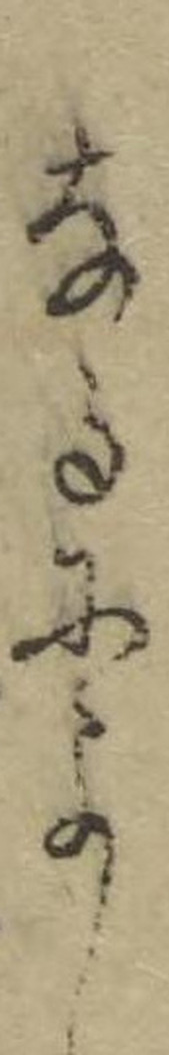なるによし
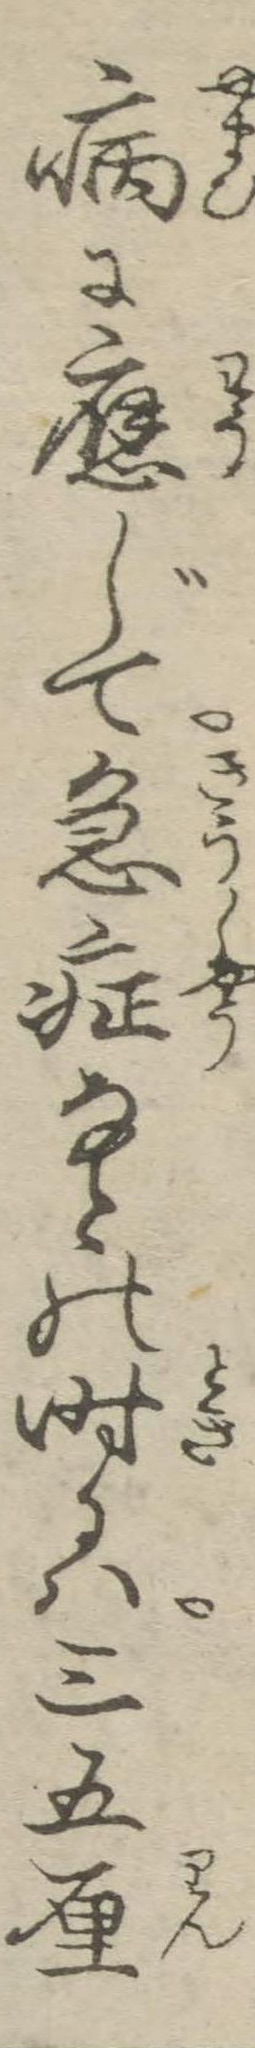病に応じて。急症なとの時には。三五厘
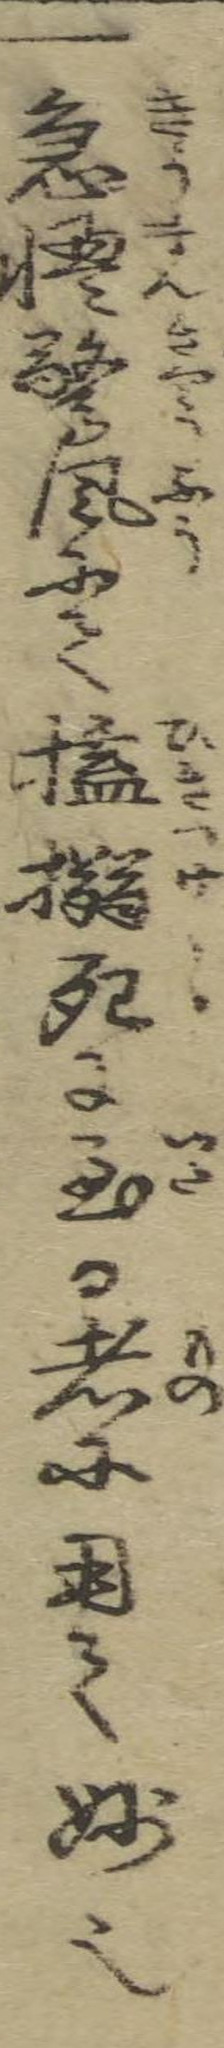一急慢驚風にて搤搦死に至る者に用て妙也
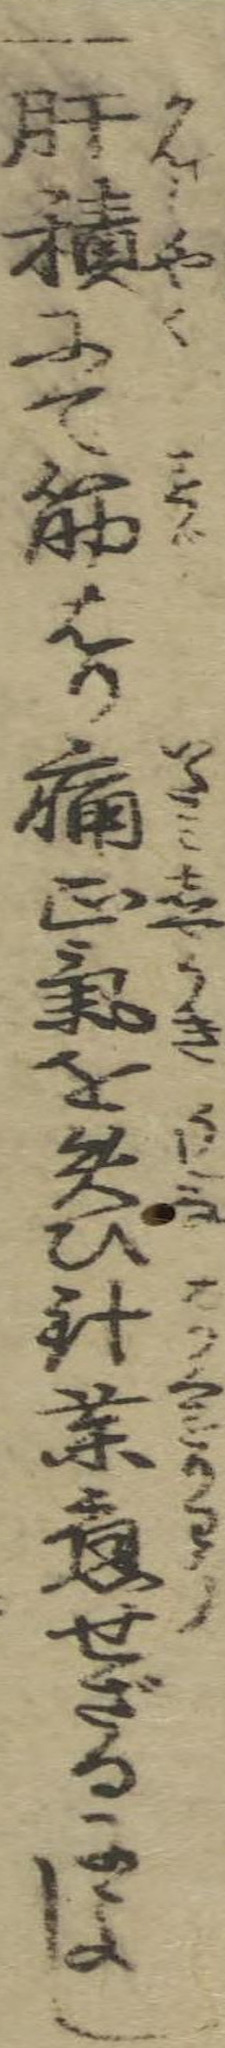一肝積にて筋はり痛正気を失ひ針薬応せざるによし
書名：浪華薬種問屋能書張交帖. 二
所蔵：国立国会図書館 National Diet Library, JAPAN
